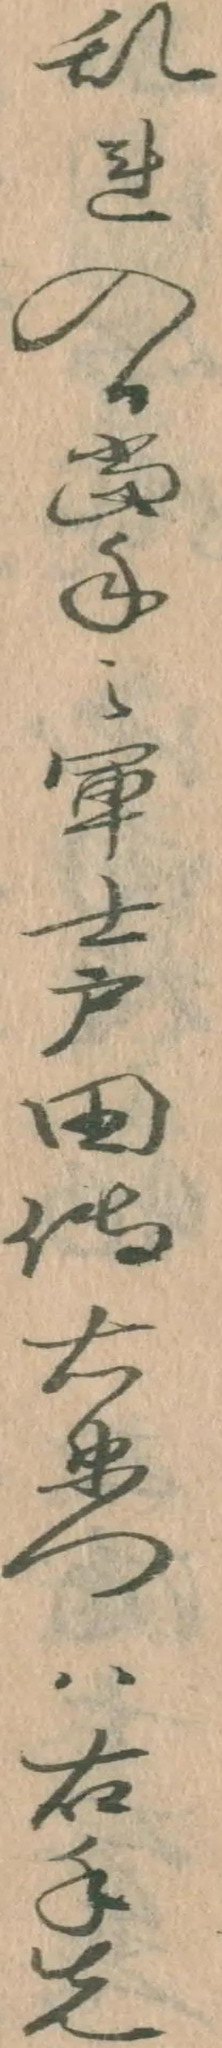乱連入る当手之軍士戸田伝右衛門は右手先
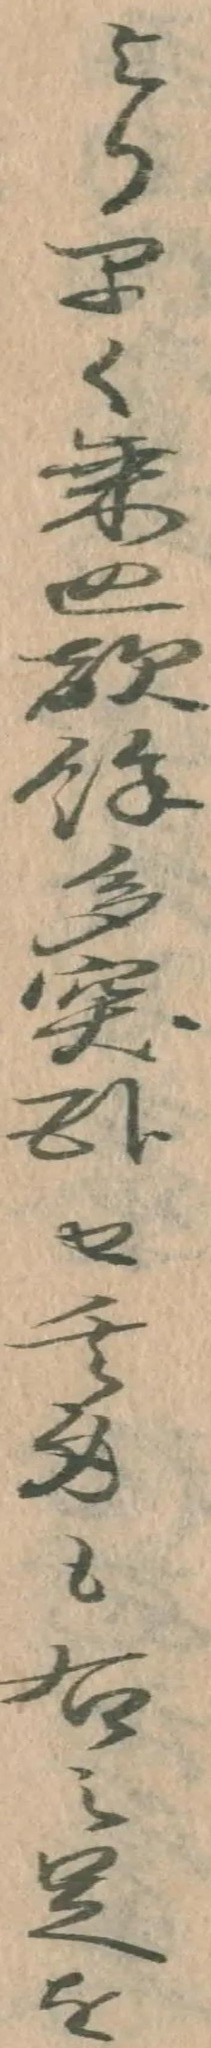与り早く乗込敵余多突臥せ其身も右之足を
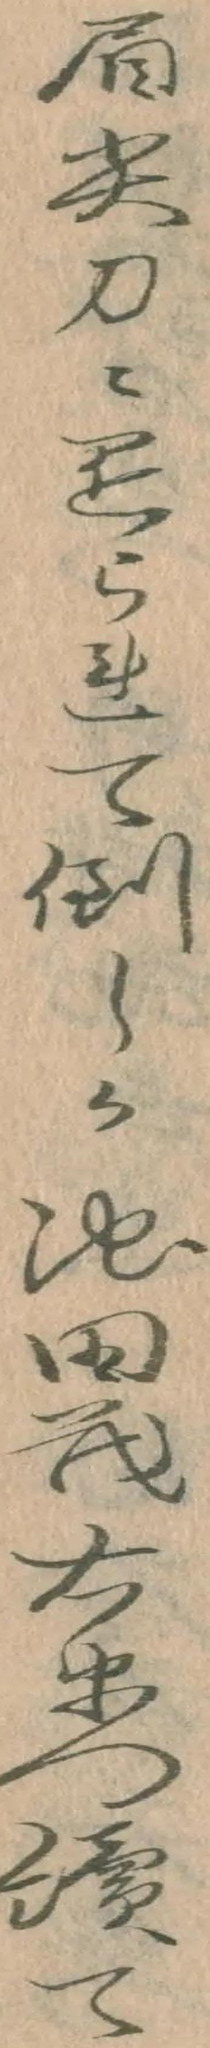眉尖刀に懸ら連て倒しか池田茂右衛門続て
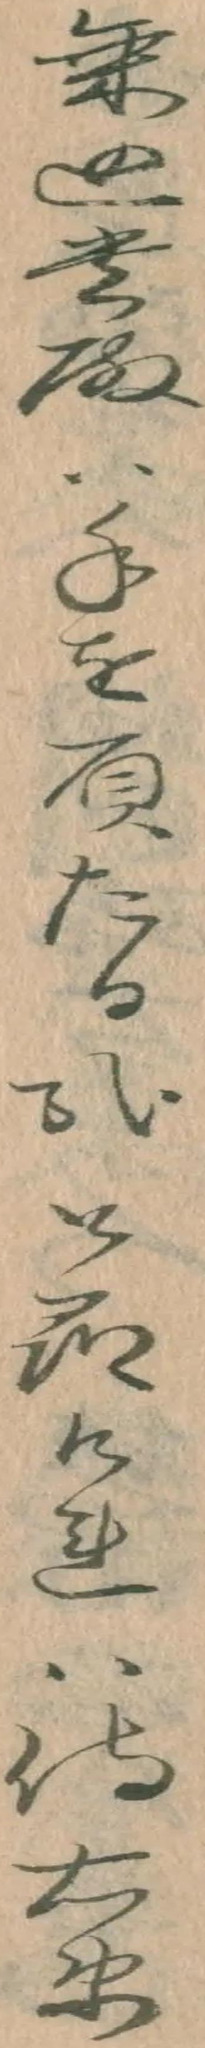乗込貴殿は手を負たる哉と尋け連は伝右衛
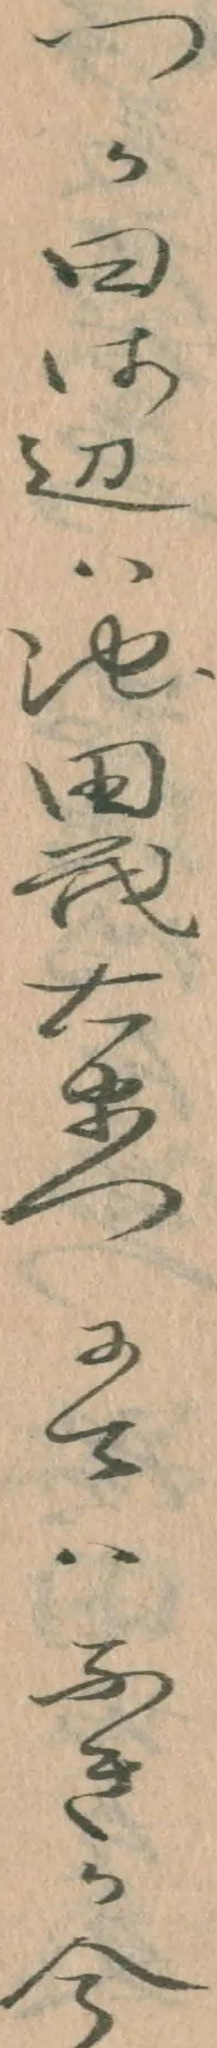門か曰御辺は池田茂右衛門尓てはなきか今
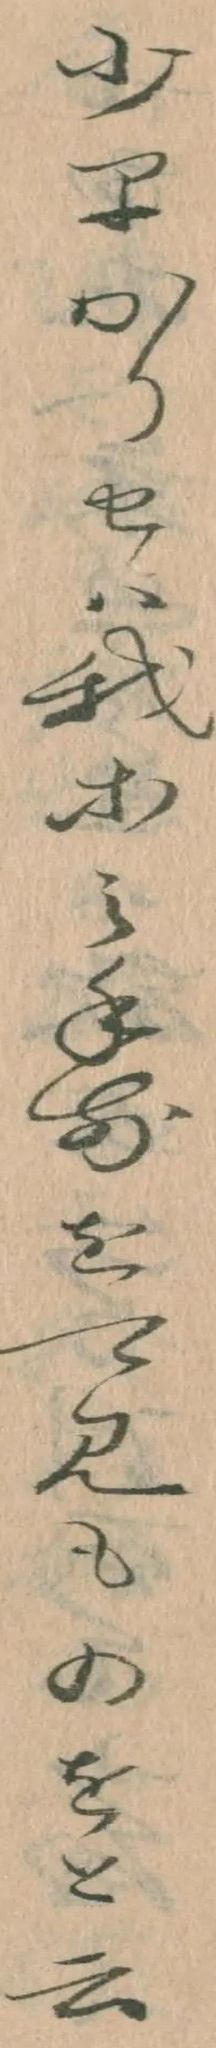少早かりせは我等之手前を可見ものをと云
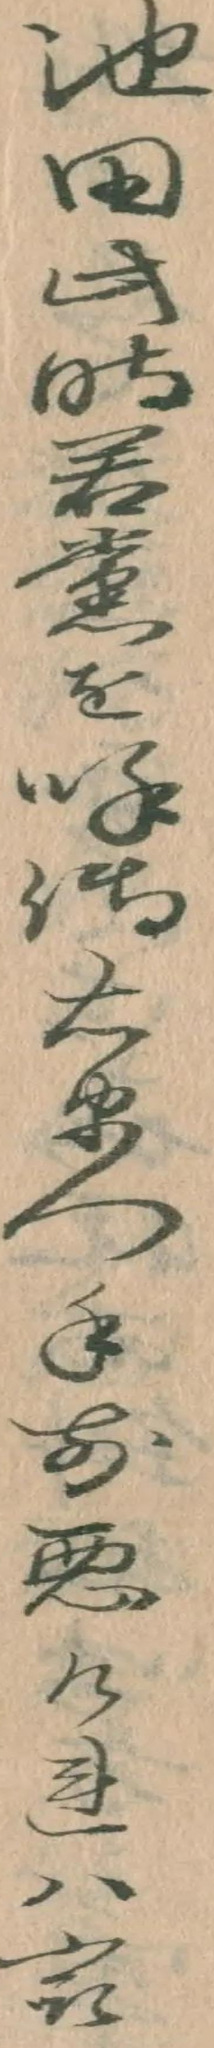池田此時若党を呼伝右衛門手前悪け連は最
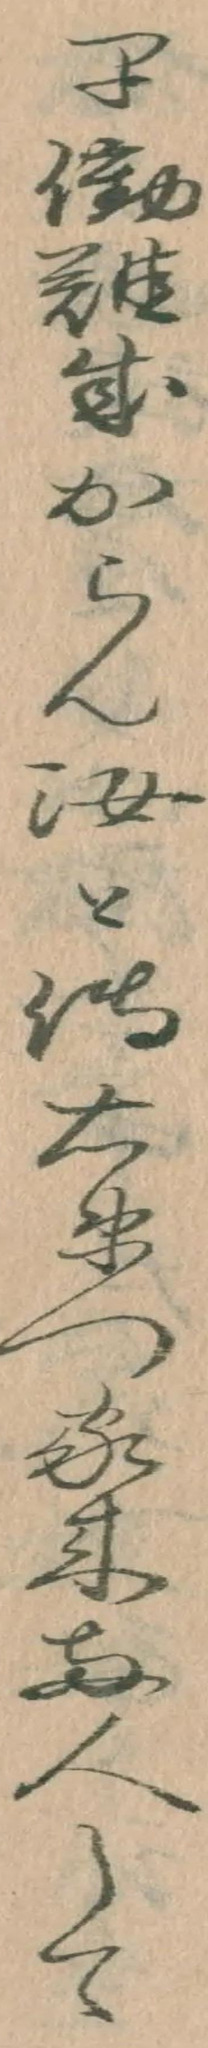早働難成からん汝と伝右衛門家来両人して
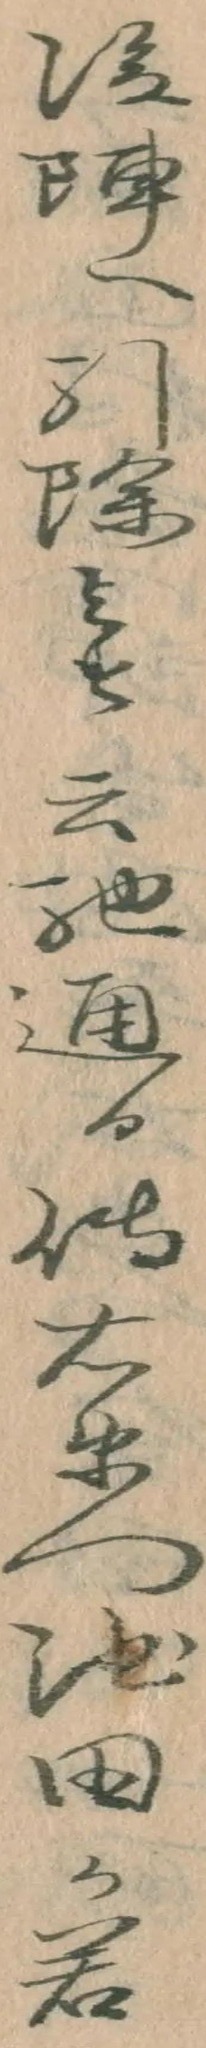後陣へ引除与と云馳通る伝右衛門池田か若
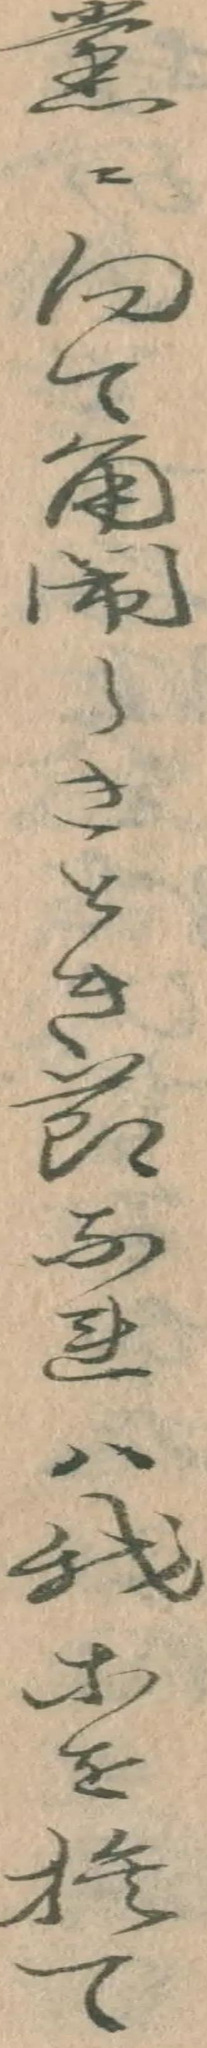党に向て角閙しきとき節な連は我等を捨て
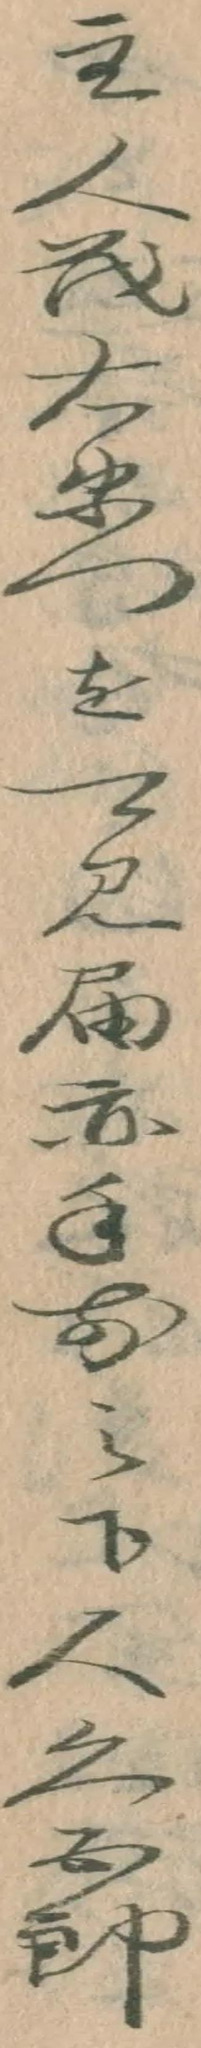主人茂右衛門を可見届亦手前之下人久五郎
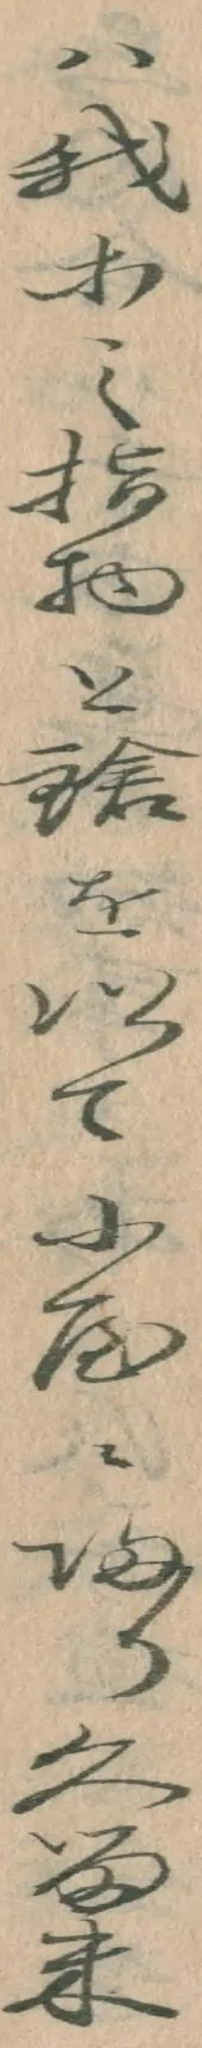は我等之指物と鎗を以て小屋に帰り久留米
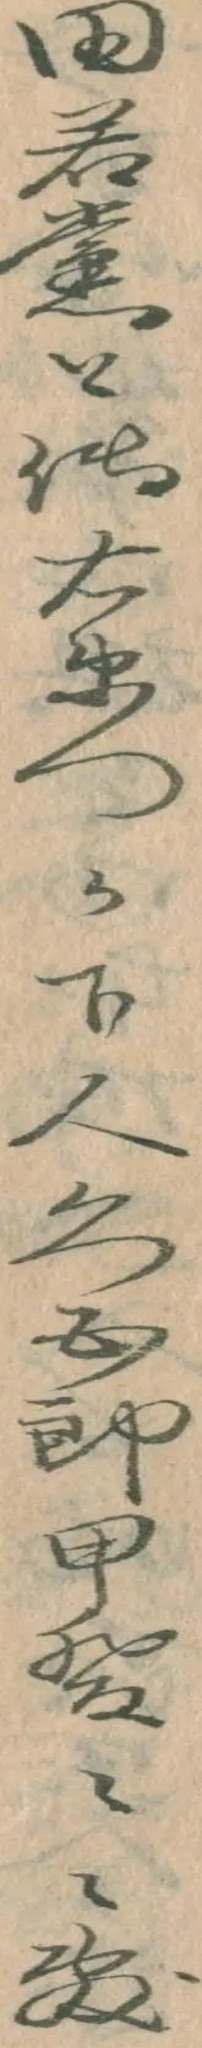田若党と伝右衛門か下人久五郎甲斐々々敷
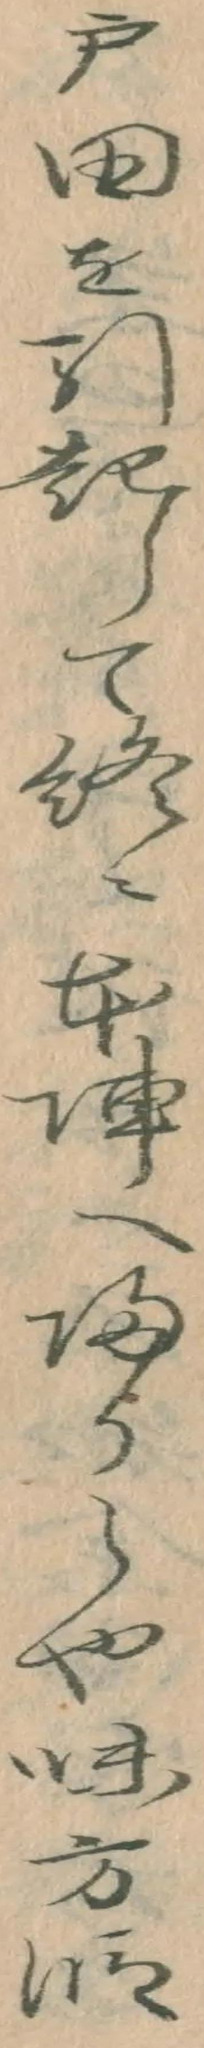戸田を引起して終に本陣へ帰りしや味方段

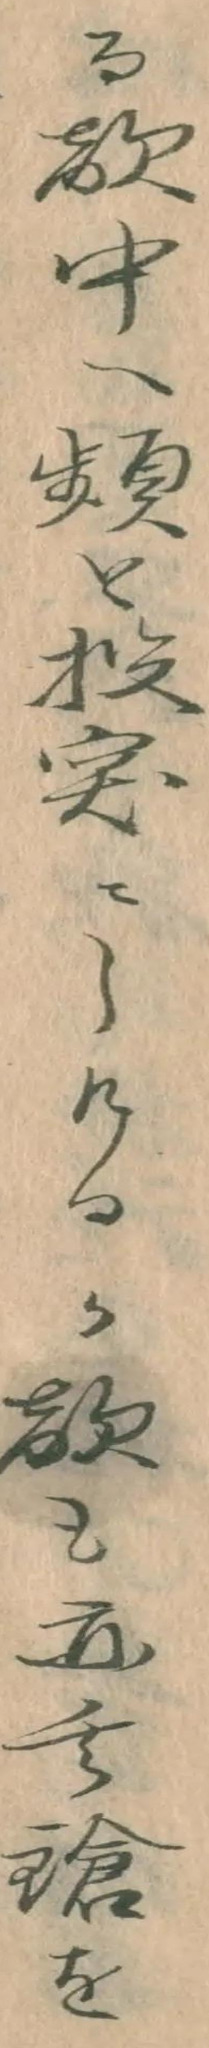る敵中へ頻と投突にしけるか敵も亦其鎗を
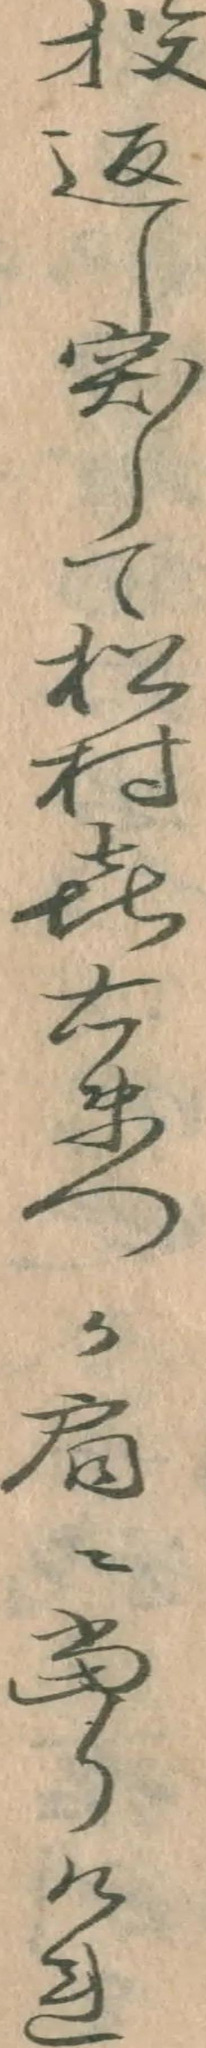投返し突して松村喜右衛門か肩に当りけ連
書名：切支丹御退治記 49巻. [9]
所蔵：国立国会図書館 National Diet Library, JAPAN
